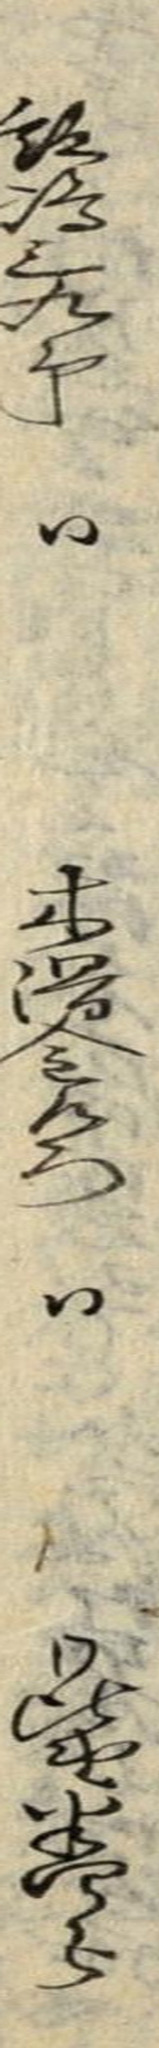同飯島三九郎同木滑金左衛門同日比野半四郎
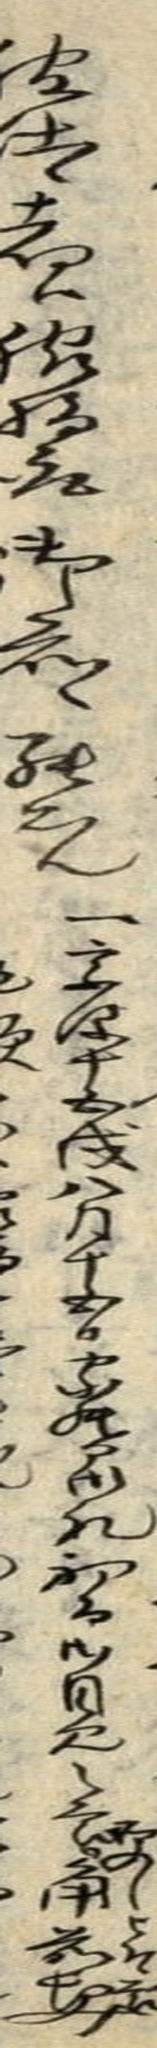服仕候者は脇指取御前へ罷出也一享保十五戌八月十五日家督御礼初而御目見之節角前髪
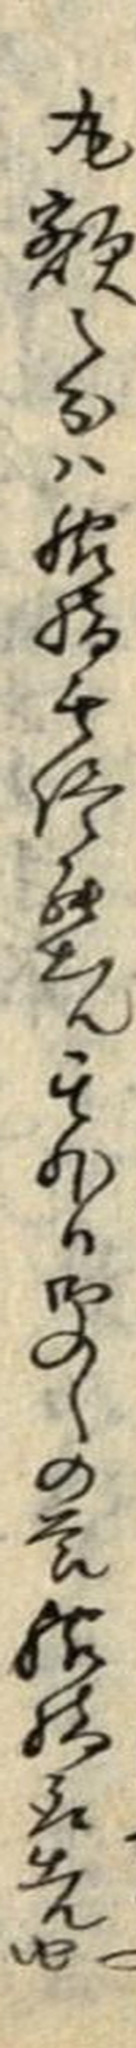丸額之分は脇指其儘罷出る其外は御のしの節脇指取出る由
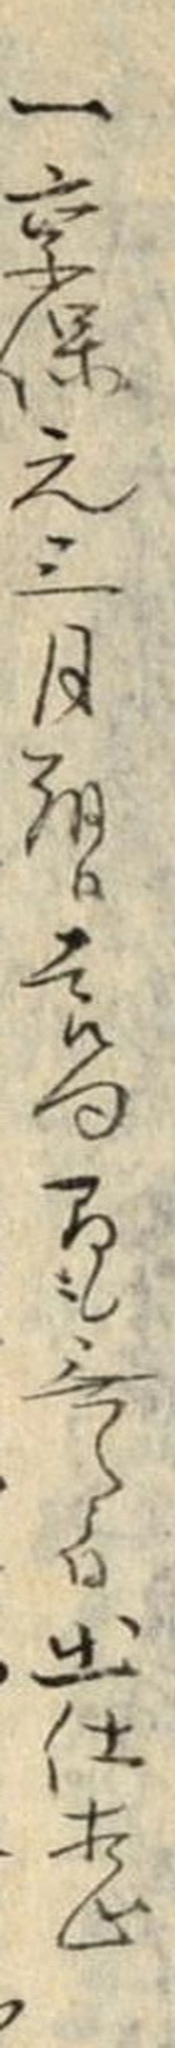一享保元三月朔日節句間も無之に付出仕相止
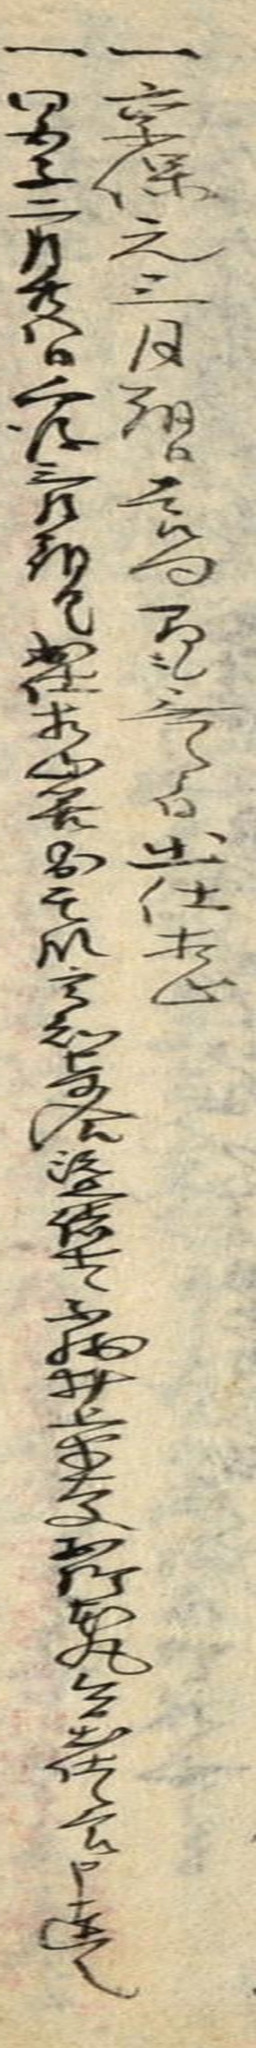一同五子二月廿八日今後三月朔日之出仕相止筈則其段高知寄合以上徒士へ不残井上半大夫於御本丸今日出仕之節申達之
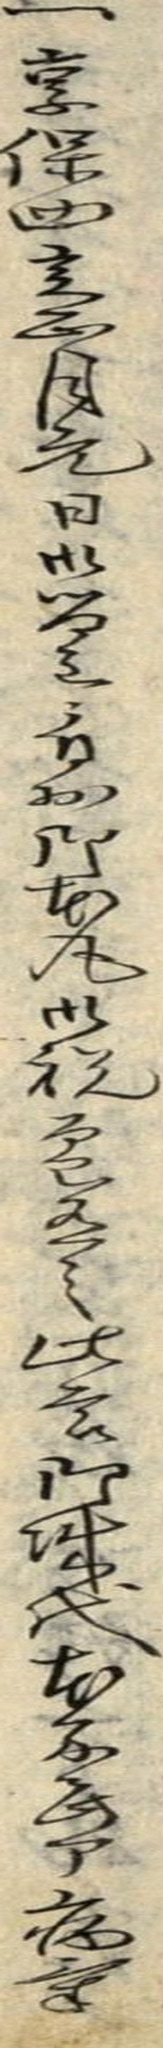一享保四亥正月元日御留主に付於御本丸御祝而已有之此節御城代本多民部病気
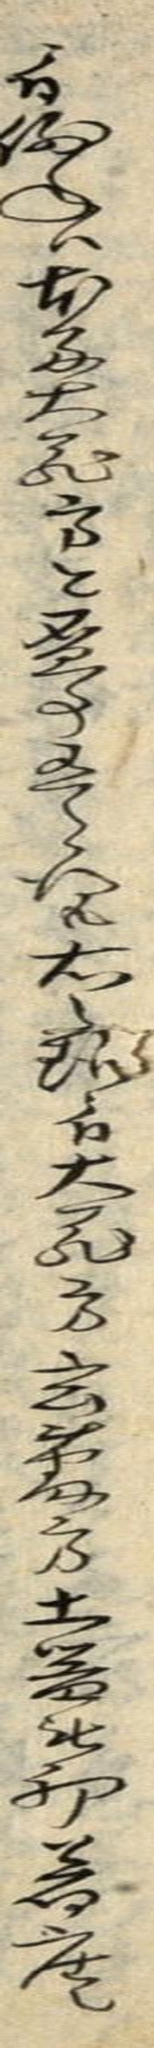に付例年は本多大蔵方と盃事有之候得共右之趣に付大蔵方玄蕃方土器被初着座候
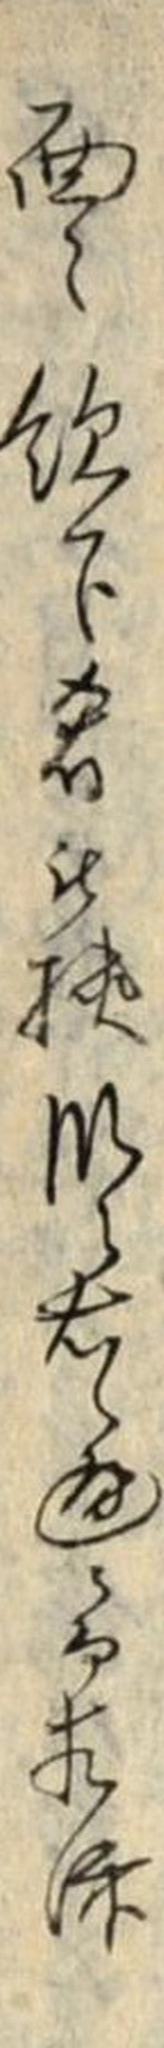面々飲下肴被挟段々右之通に而相済

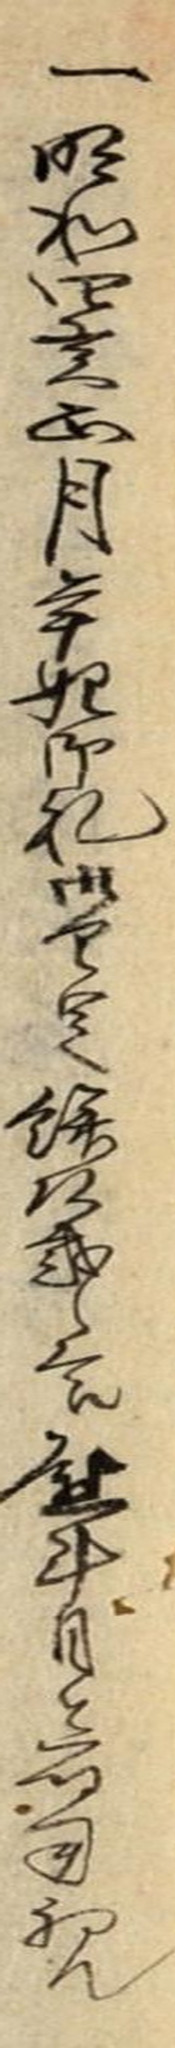一明和四亥正月年始御礼御具足餅頂戴之節熨斗目着用初る
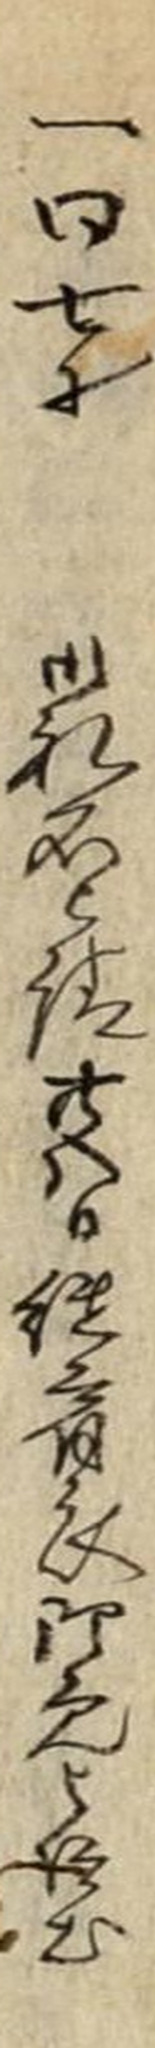一同七寅御礼不被請廿八日継肩衣御免被仰出
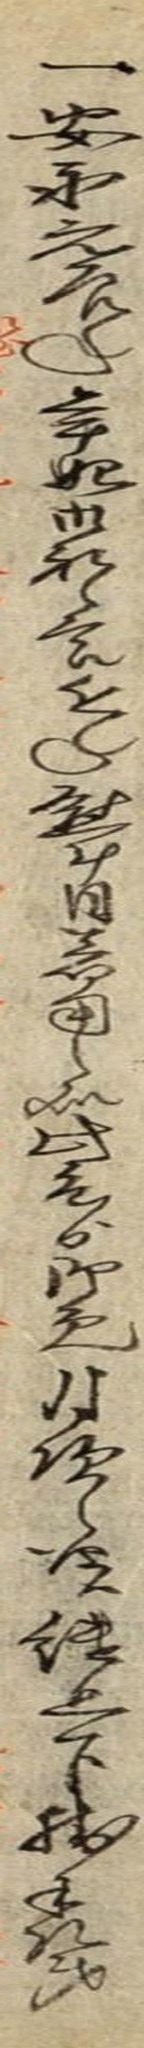一安永元辰年年始御礼之節近年熨斗目着用之処此度ゟ御免月次之儀は継上下勝手次第
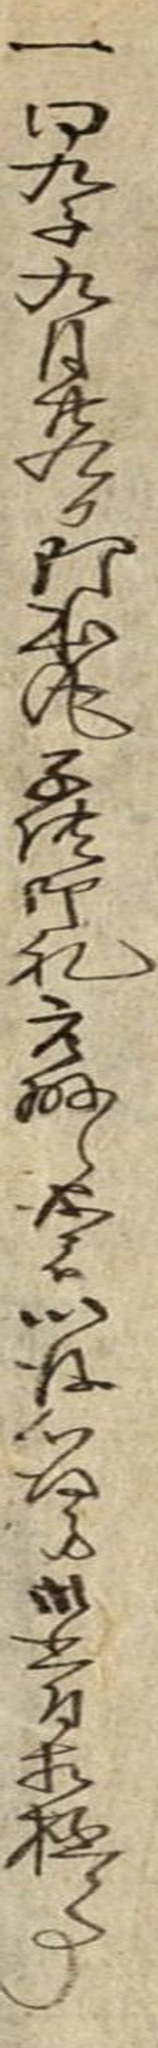一同九子九月廿九日御本丸子供御礼取扱之儀に付以後心得方御書付相極候事
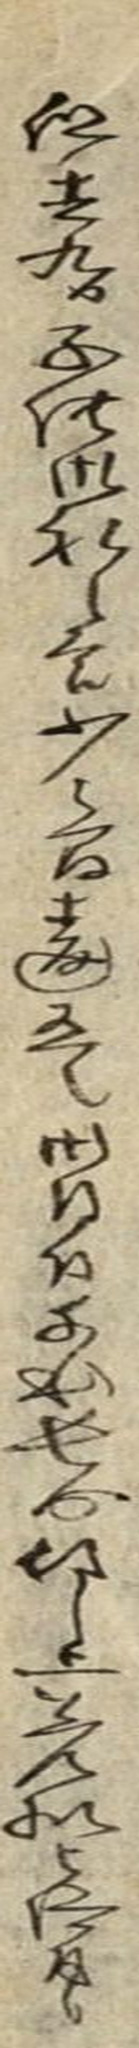但去九日子供御礼之節少々間違有之御目付千本長右衛門伺之上差扣被仰付候
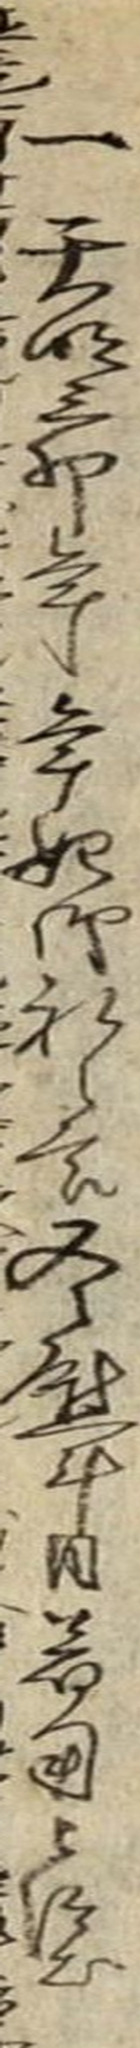一天明三卯年年始御礼之節又々熨斗目着用被仰出
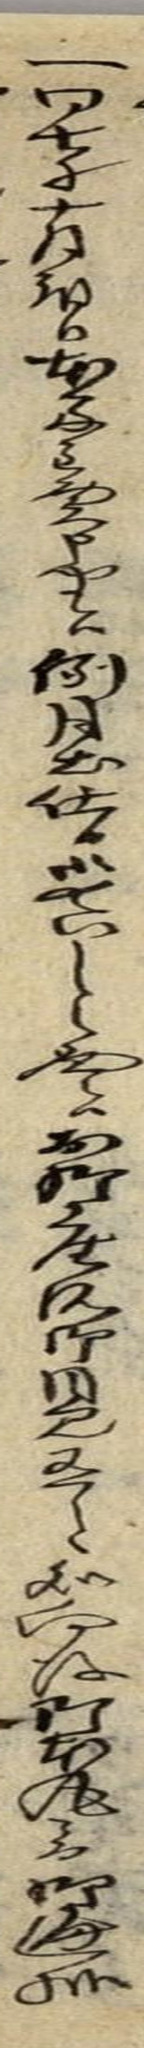一同七寅十月朔日本多主殿申聞候は例月出仕日御匙いし之面々於御座所御目見有之候処向後御本丸に而御通掛
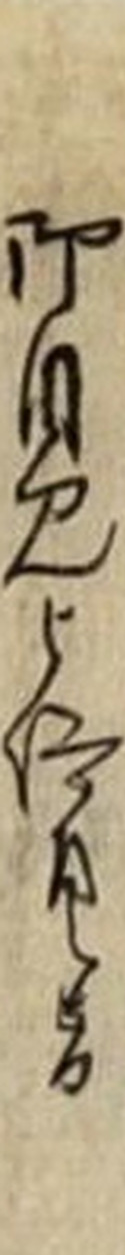御目見被仰付候旨
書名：蒐輯之部
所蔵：福井県文書館 Fukui Prefectural Archives
